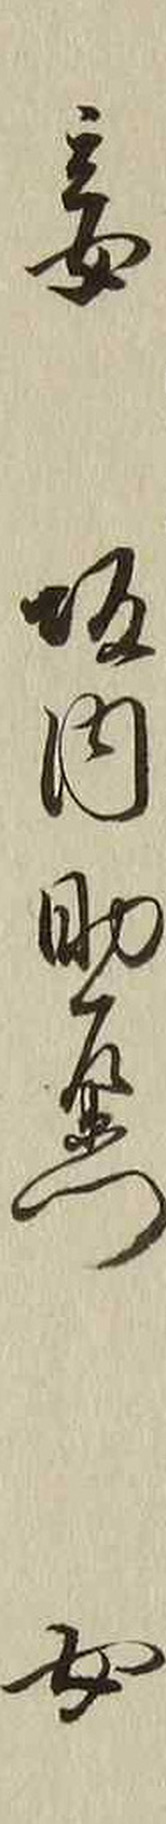妾坂内助左衛門女
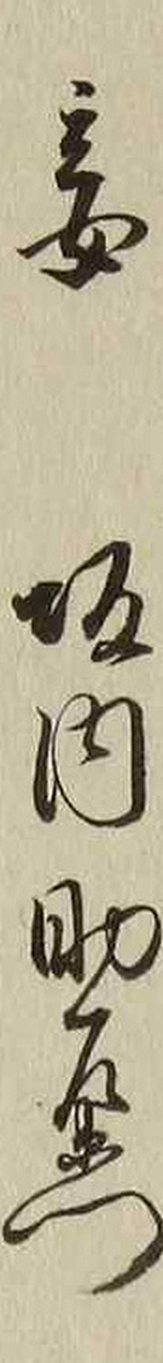妾坂内助左衛門女
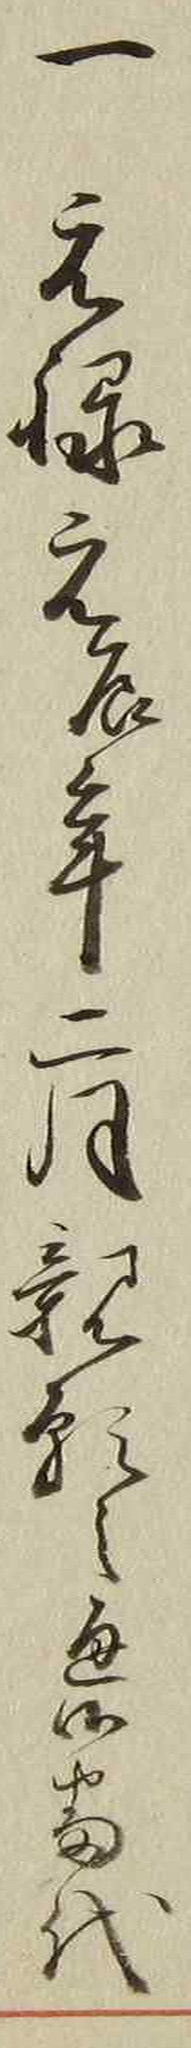一元禄元辰年二月親願い之通り御番代
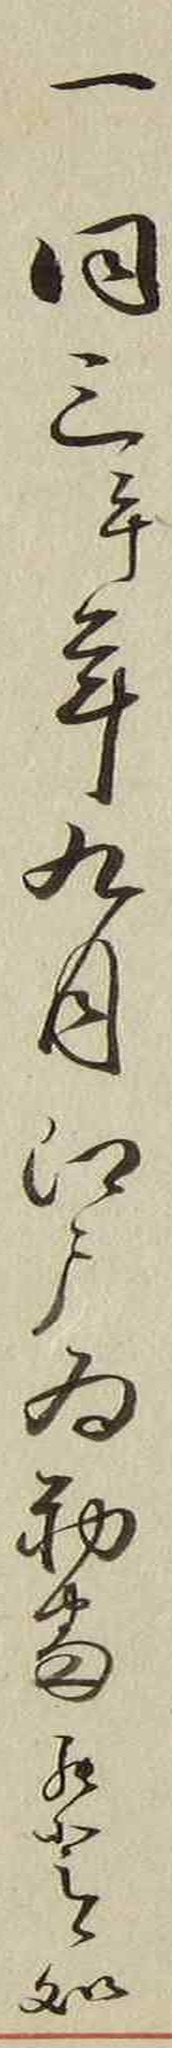一同三午年九月江戸勤番之為罷り登り候処
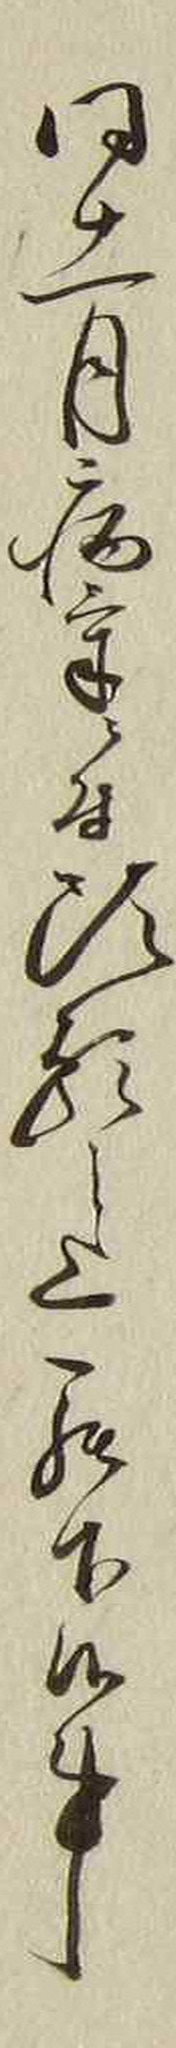同十一月病気ニ付き頭願い之上罷り下り候事
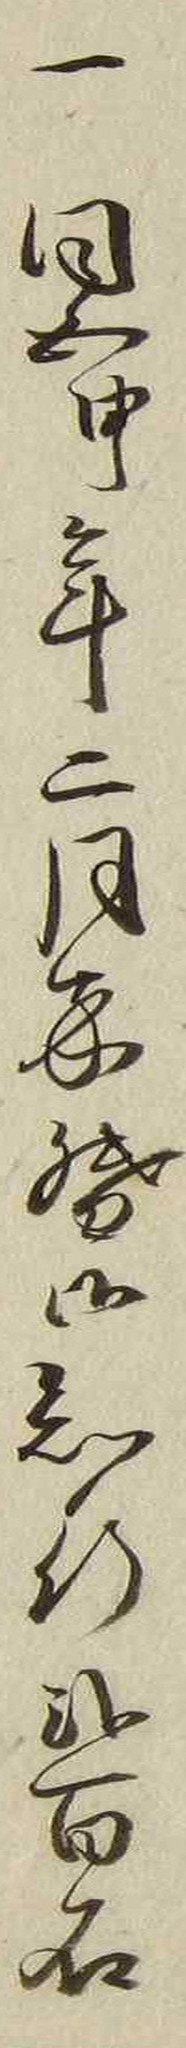一同五申年二月家督御知行弐百石

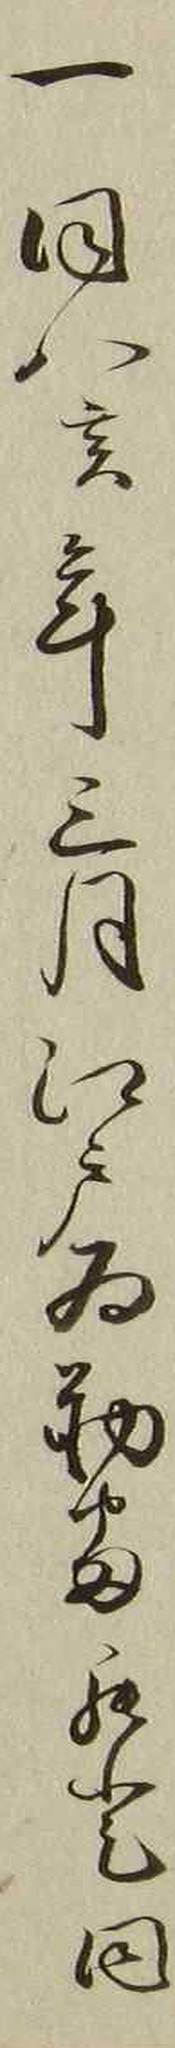一同八亥年三江戸勤番之為罷り登り同
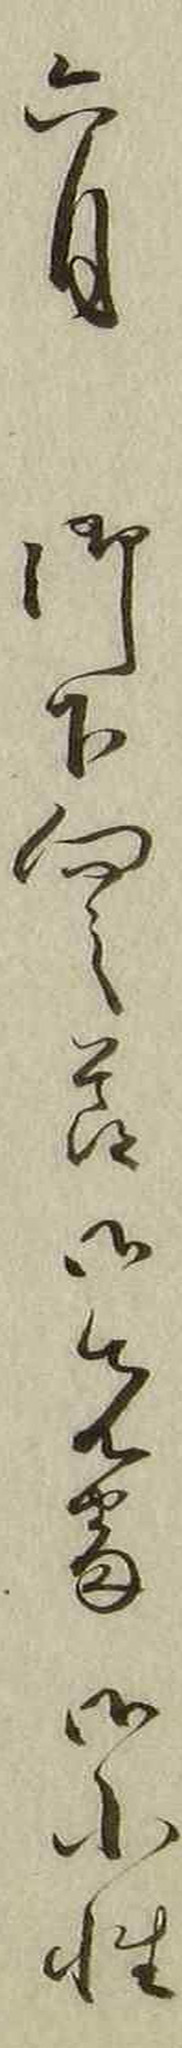六月下向之節御先番御小姓
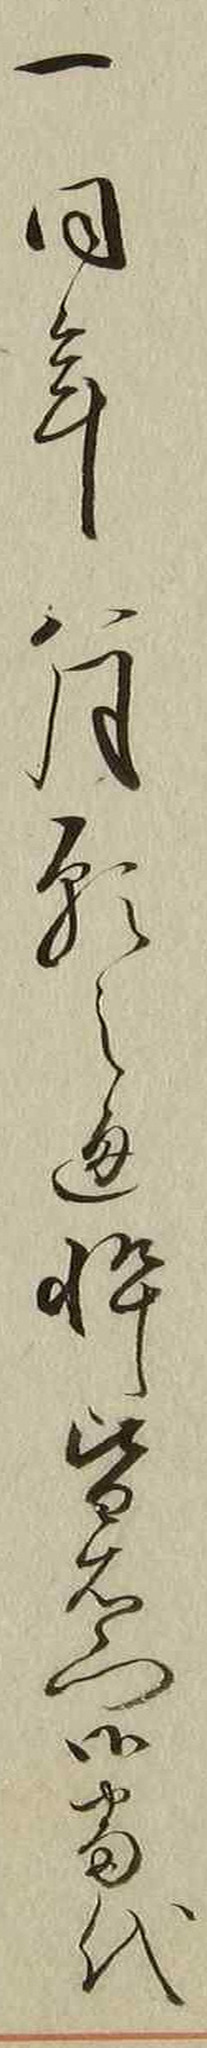一同年八月願い之通り倅皆右衛門御番代
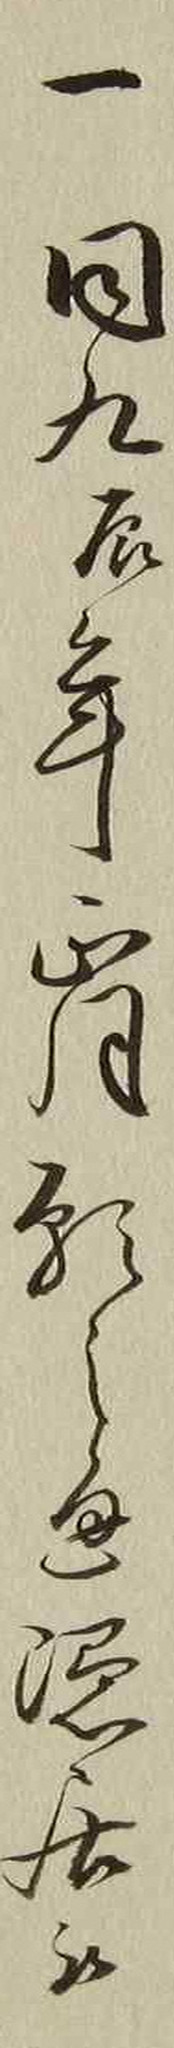一同九辰年正月願い之通り隠居
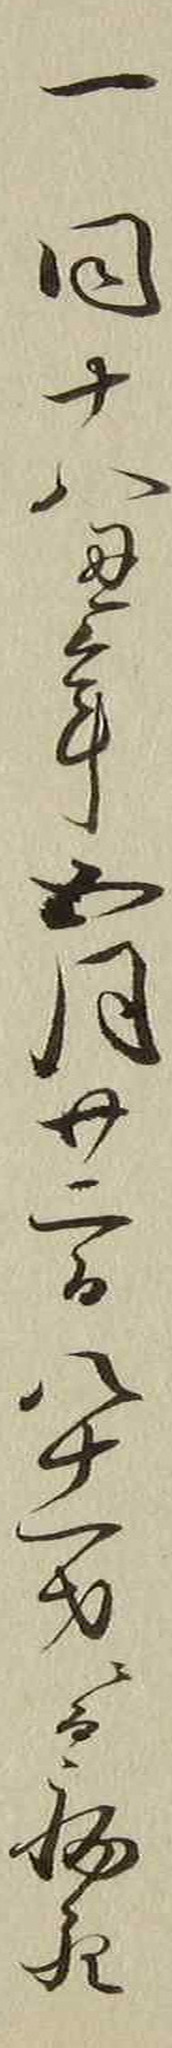一同十八丑年五月廿二日八十一才ニて病死
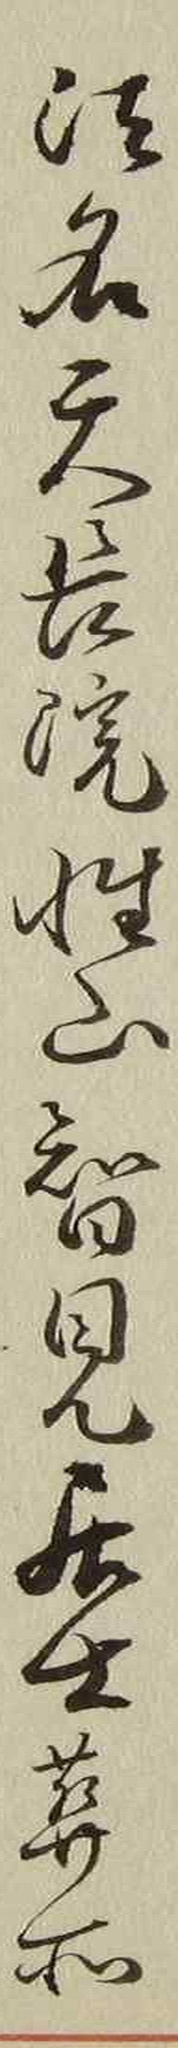法名天長院性山智見居士葬所
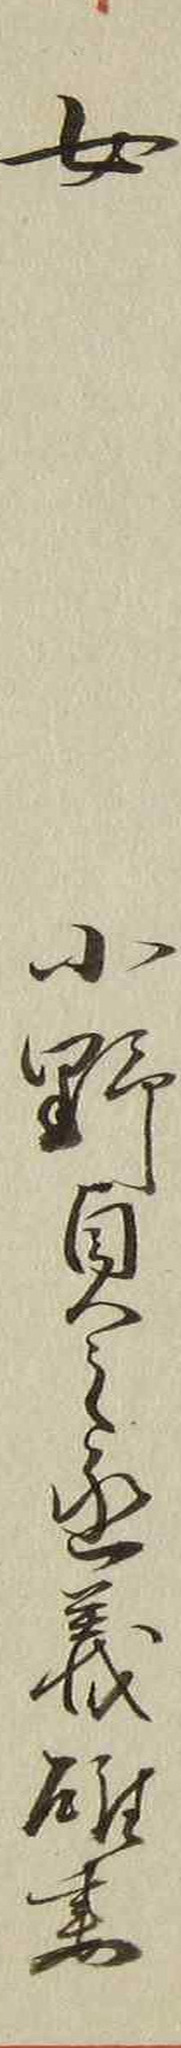女小野貞之丞義雄妻
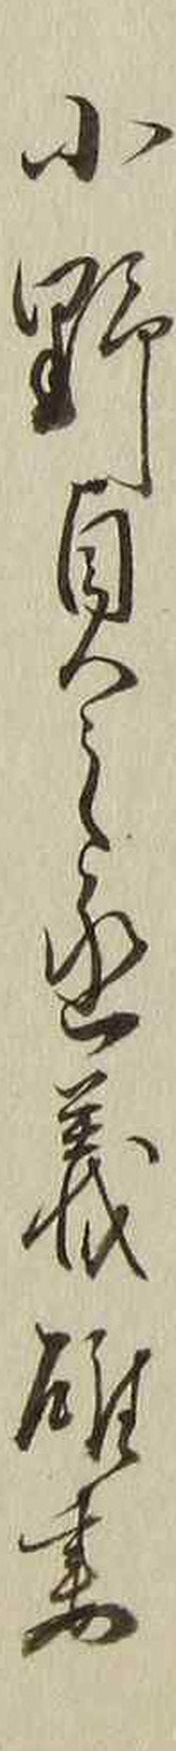女小野貞之丞義雄妻
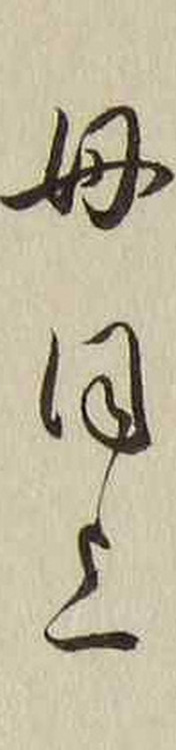母同上

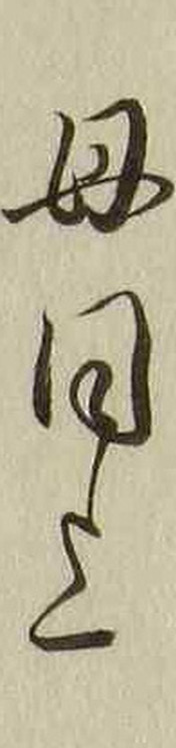母同上
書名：諸士系譜　巻之20　い之部20
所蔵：会津若松市立会津図書館
